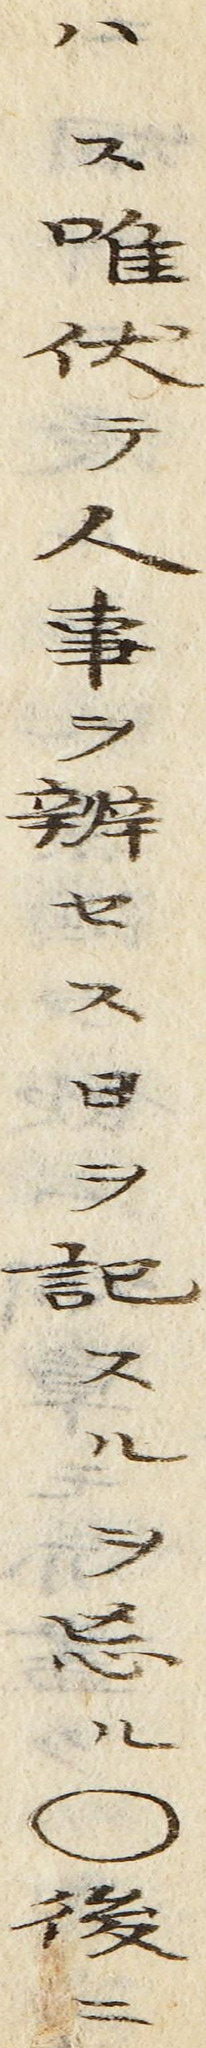ハス唯伏テ人事ヲ弁セス日ヲ記スルヲ忘ル◯後ニ
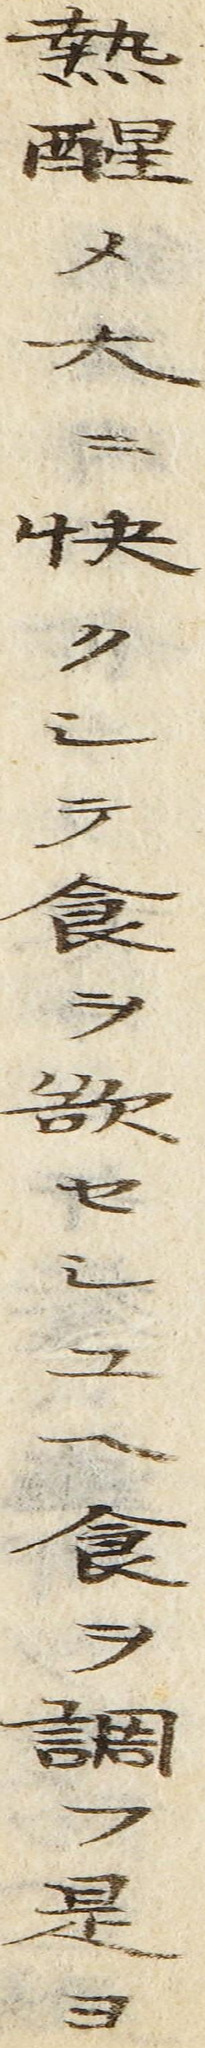熱醒メ大ニ快クシテ食ヲ欲セシユヘ食ヲ調フ是ヨ
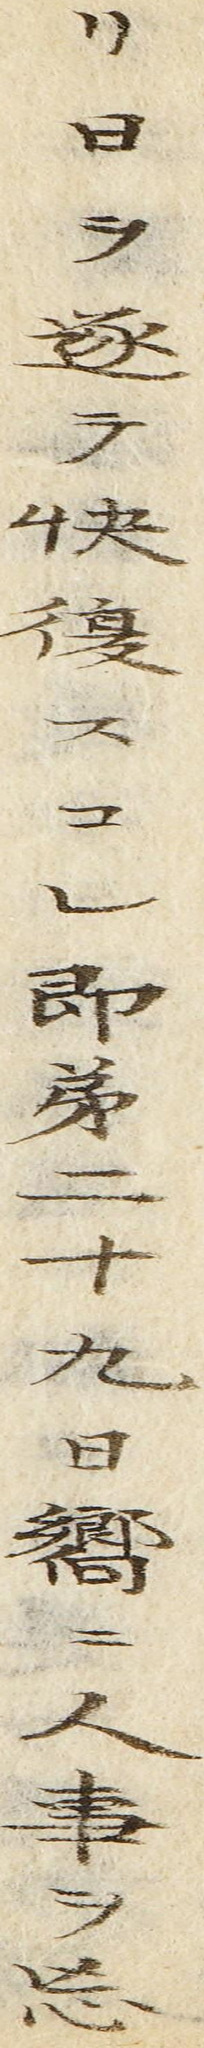リ日ヲ逐テ快復スコレ即第二十九日嚮ニ人事ヲ忘
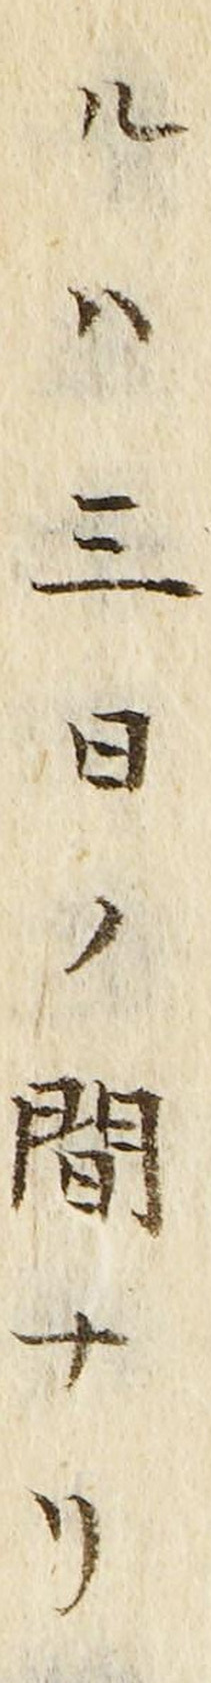ルハ三日ノ間ナリ

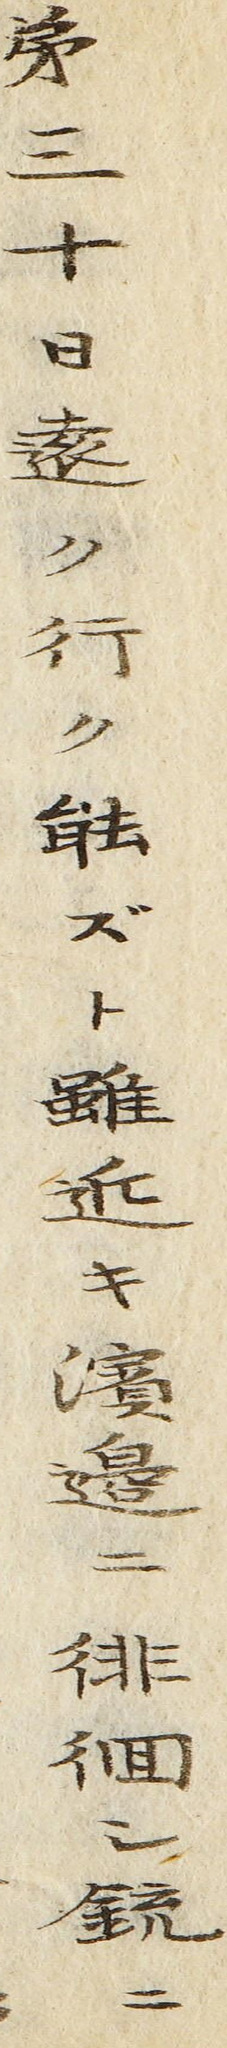第三十日遠ク行ク能ズト雖近キ浜辺ニ徘徊シ銃ニ
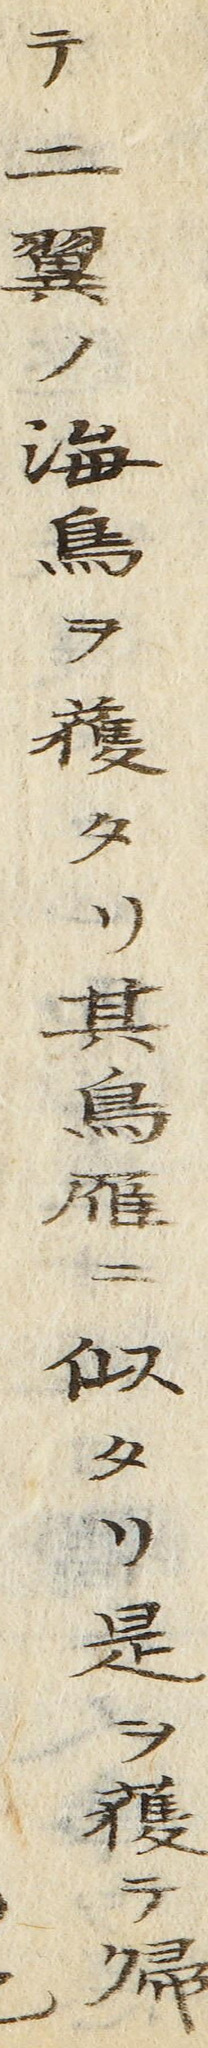テ二翼ノ海鳥ヲ獲タリ其鳥雁ニ似タリ是ヲ獲テ帰
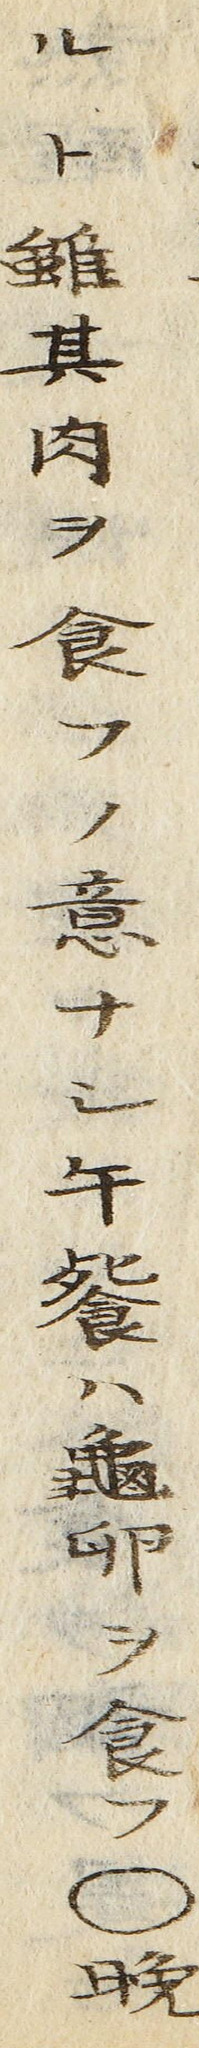ルト雖其肉ヲ食フノ意ナシ午餐ハ亀卵ヲ食フ◯晩
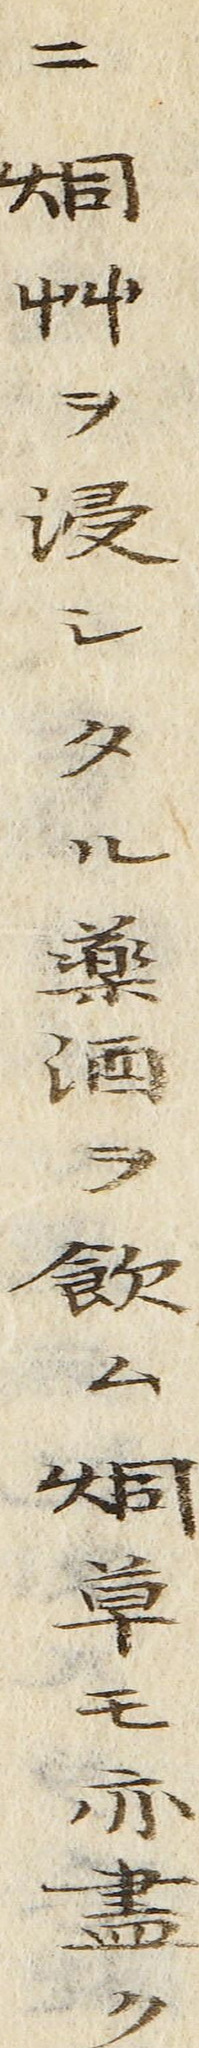ニ煙草ヲ浸シタル薬酒ヲ飲ム煙草モ亦尽ク
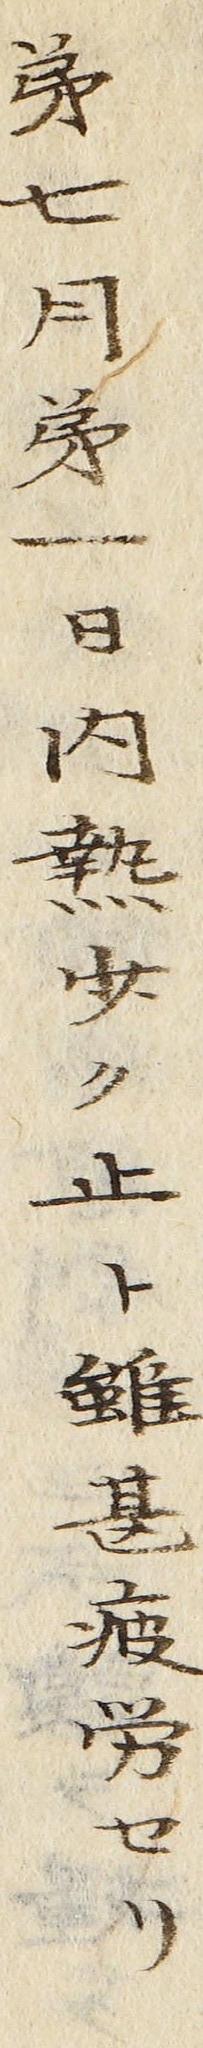第七月第一日内熱少ク止ト雖甚疲労セリ
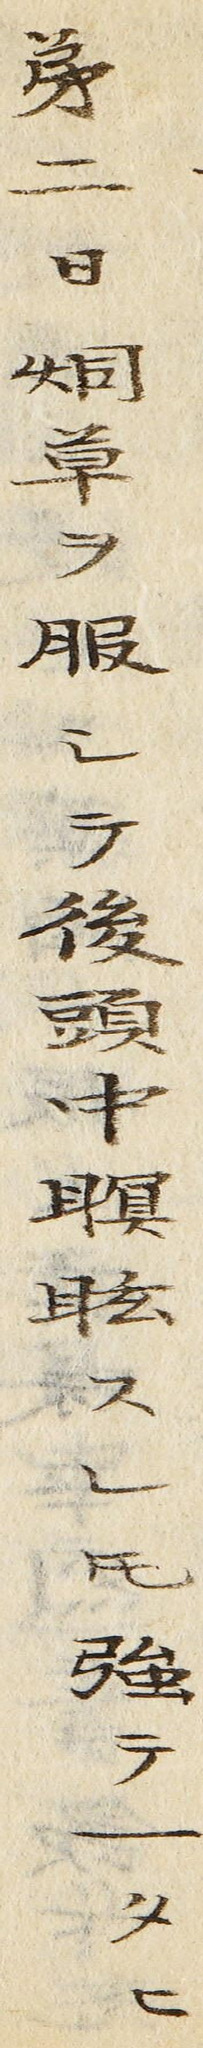第二日煙草ヲ服シテ後頭中瞑眩スレトモ強テ一タヒ
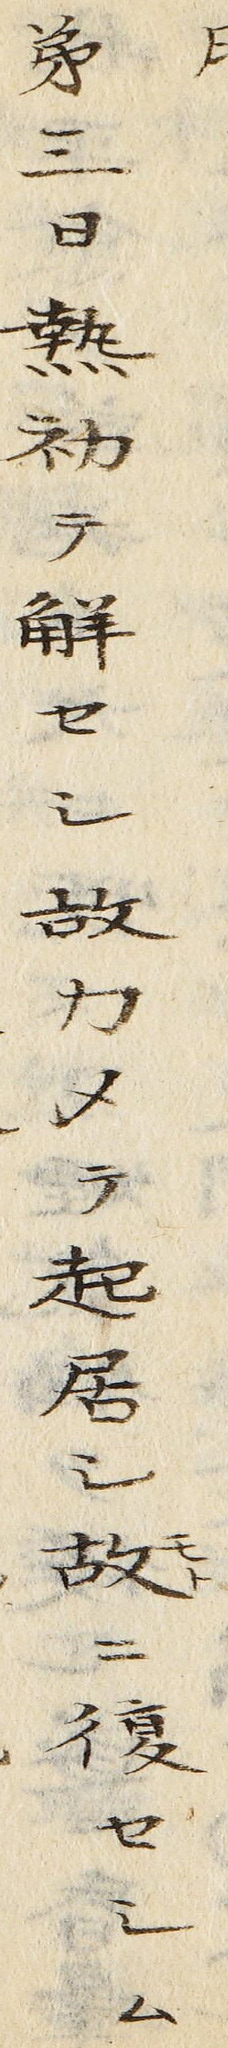第三日熱初テ解セシ故力シメテ起居シ故ニ復セシム
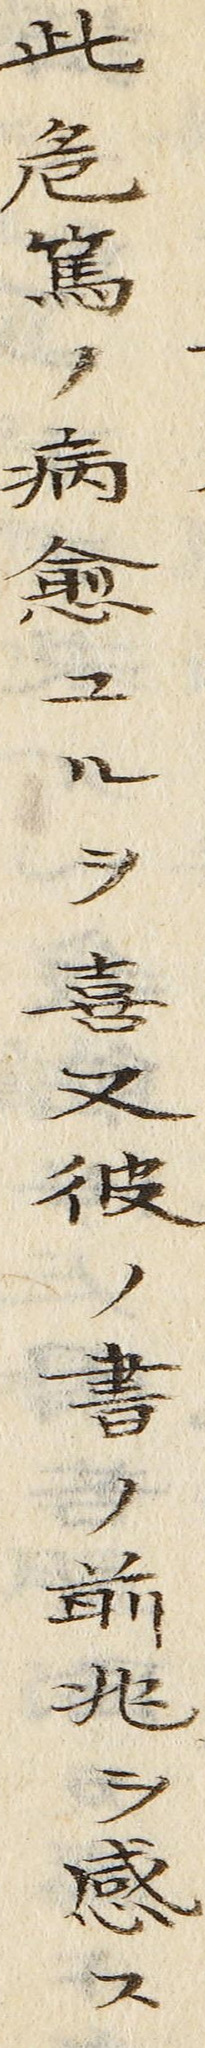此危篤ノ病愈ユルヲ喜又彼ノ書ノ前兆ヲ感ス
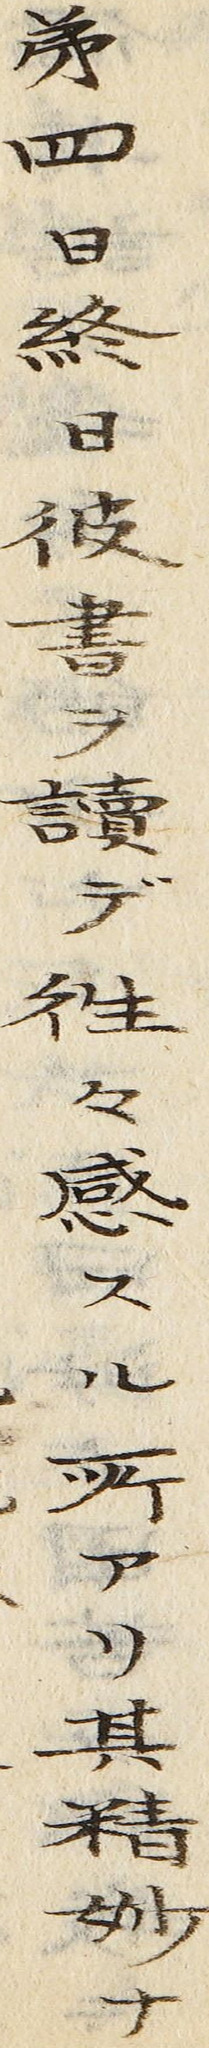第四日終日彼書ヲ読デ往々感スル所アリ其精妙ナ
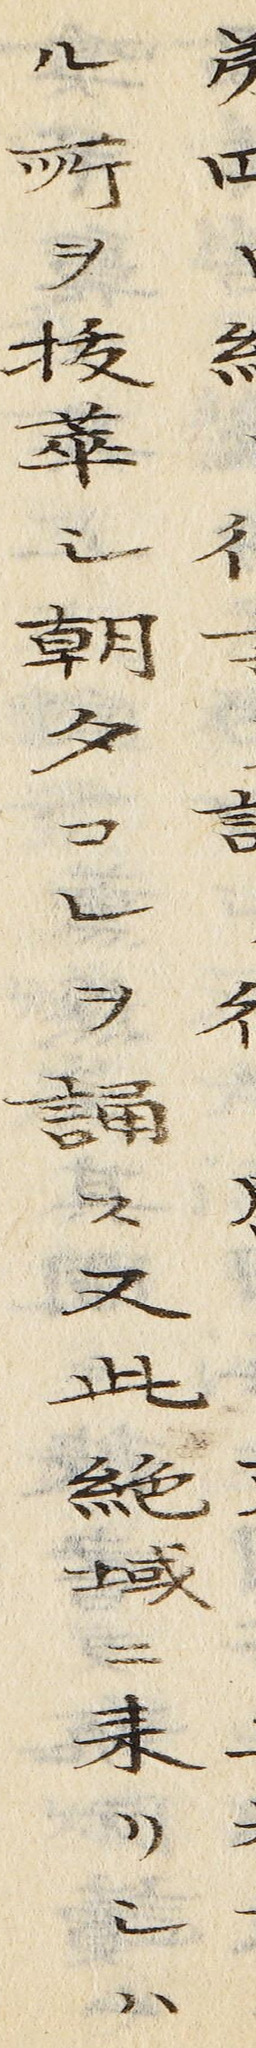ル所ヲ抜萃シ朝夕コレヲ誦ス又此絶域ニ来リシハ
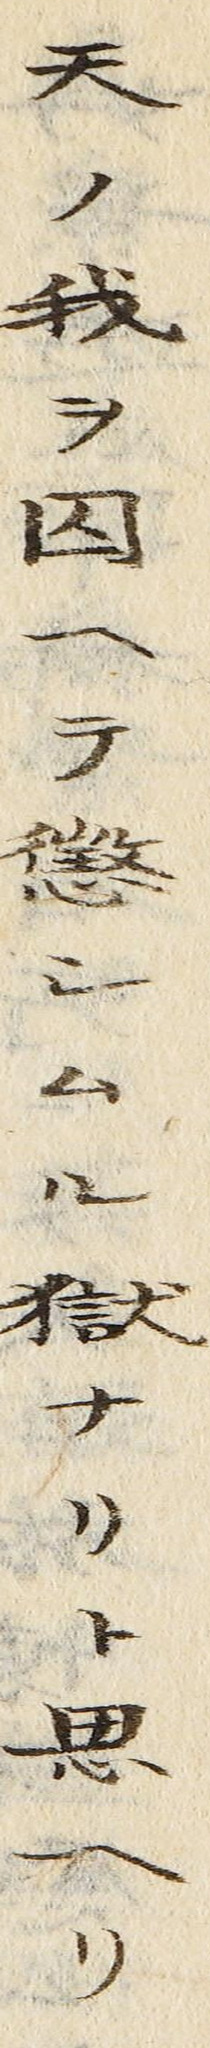天ノ我ヲ囚ヘテ懲シムル獄ナリト思ヘリ
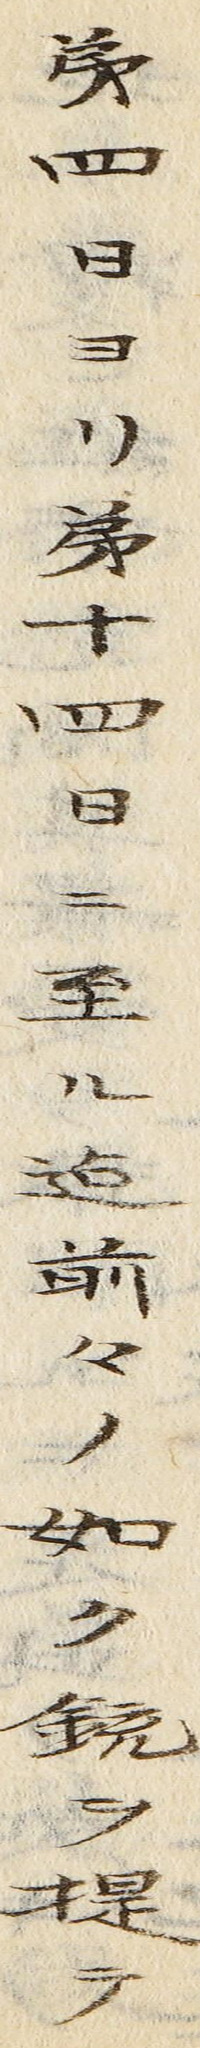第四日ヨリ第十四日ニ至ル迄前々ノ如ク銃ヲ提テ
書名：漂流紀事
